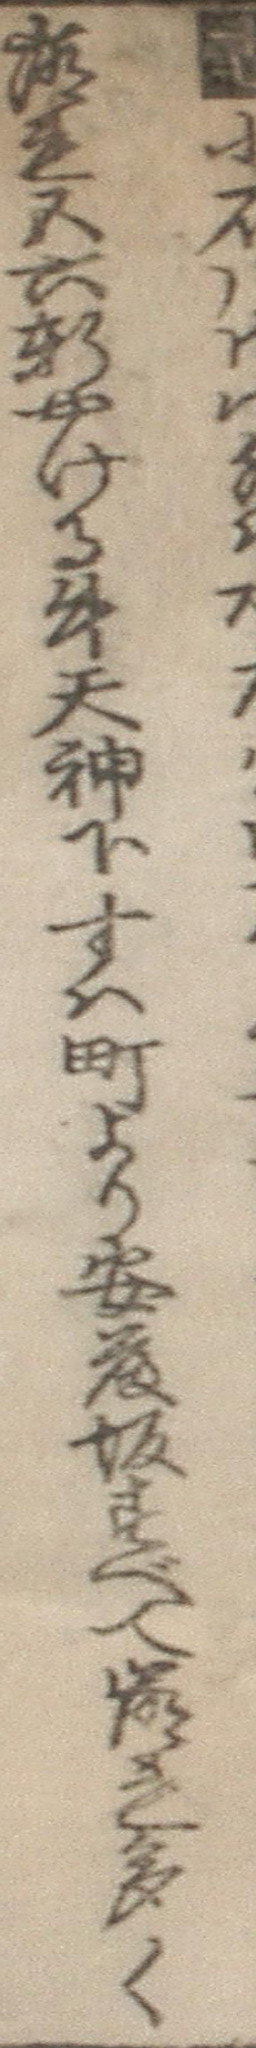崩れ五六軒やける牛天神下すは町より安藤坂辺すべて崩れ多く
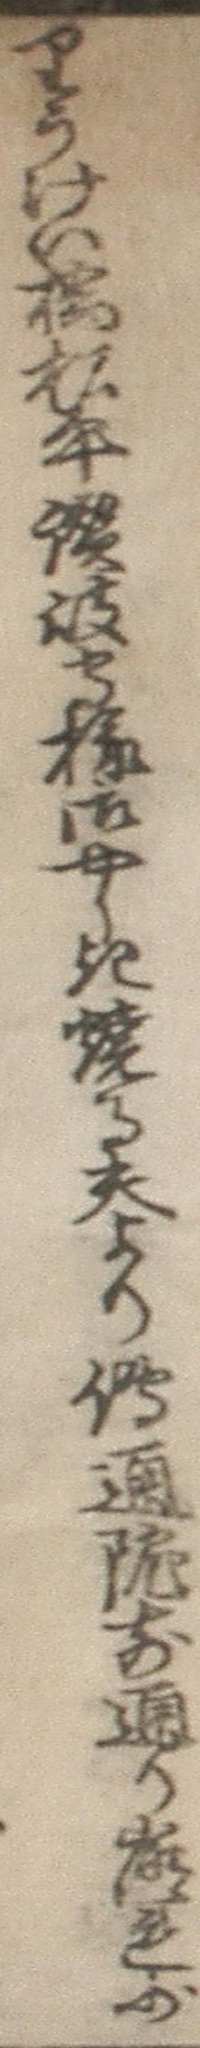りうけい橋松平讃岐守様御やしき焼る夫より伝通院前通り崩れ少
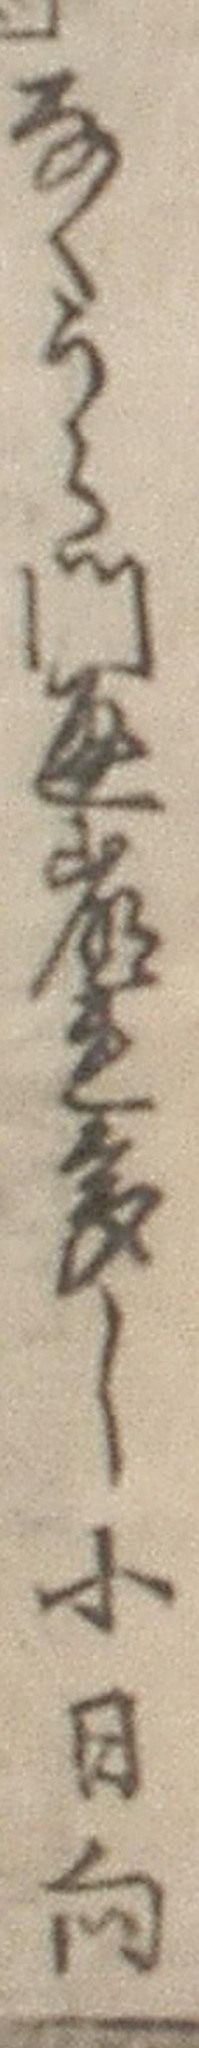なくうら門通崩れ多し小日向
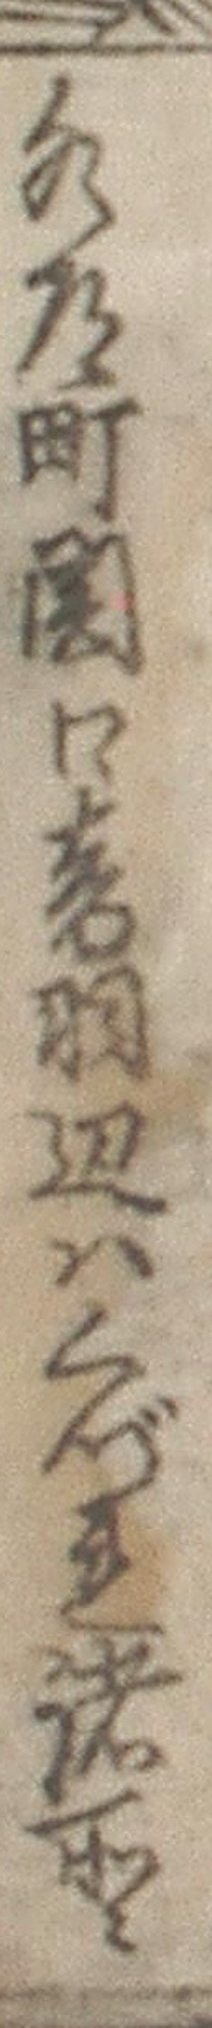水道町関口音羽辺はくづれ諸所〻
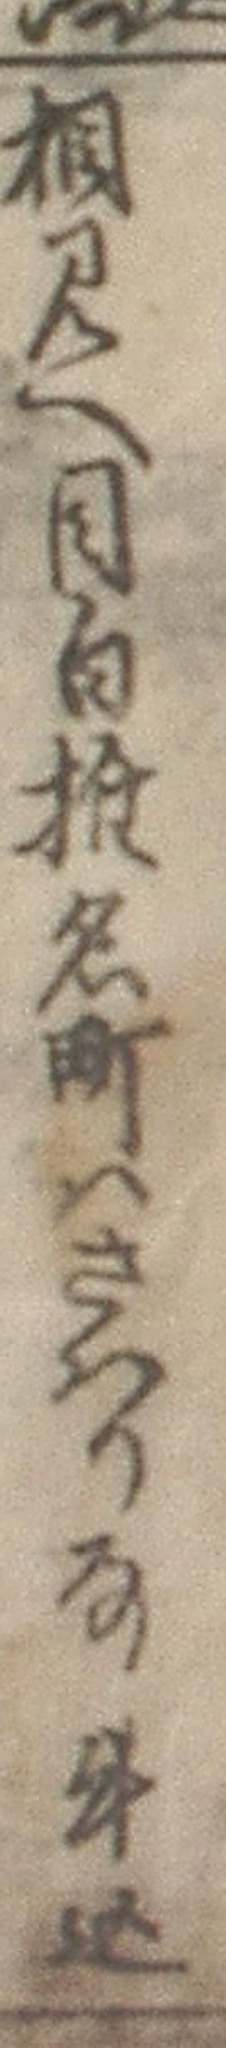相見へ目白椎名町はさはりなし牛込
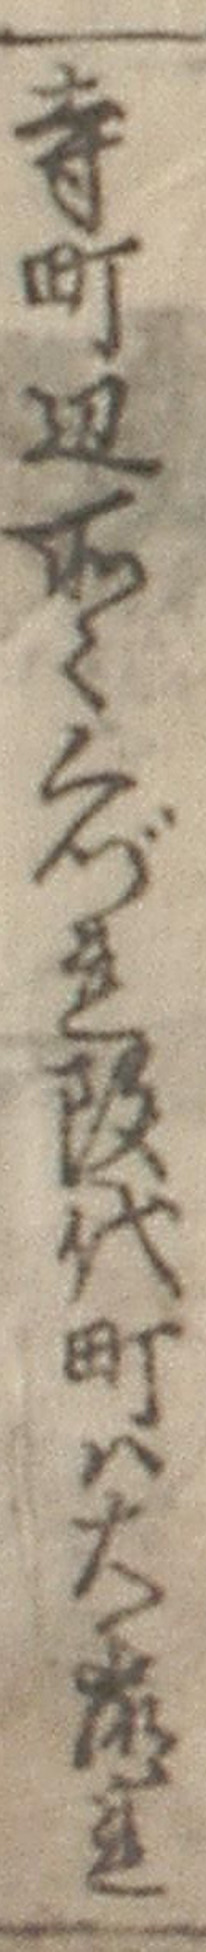寺町辺所〻くづれ改代町は大崩れ
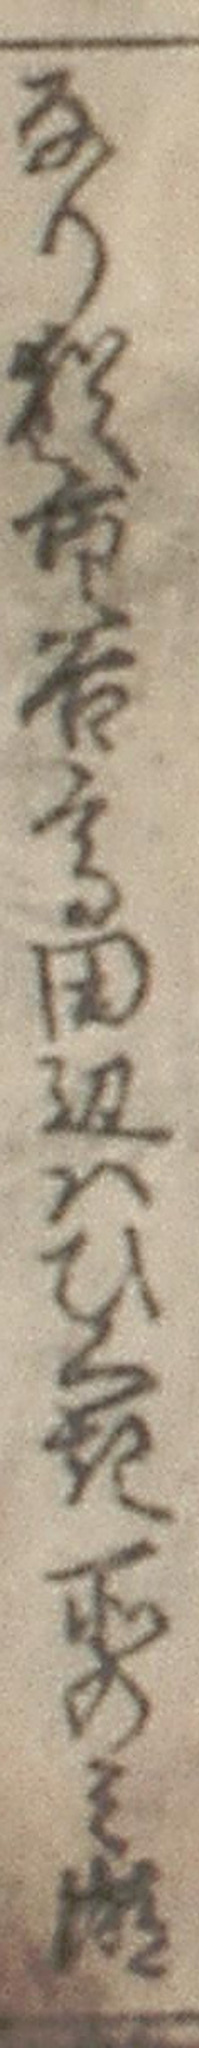なり猶市谷高田辺はひくき所のみ崩
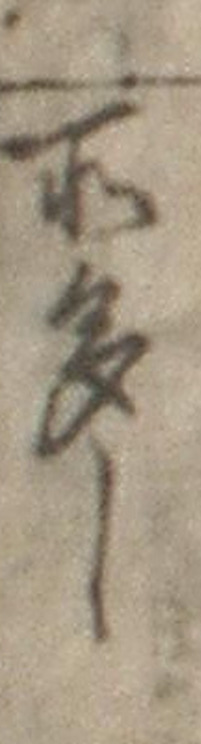所多し

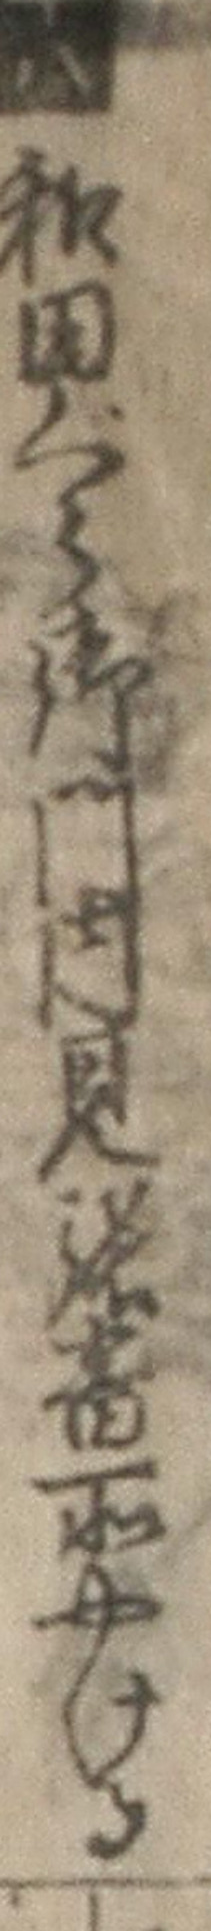十八和田くら御門内見張番所やける
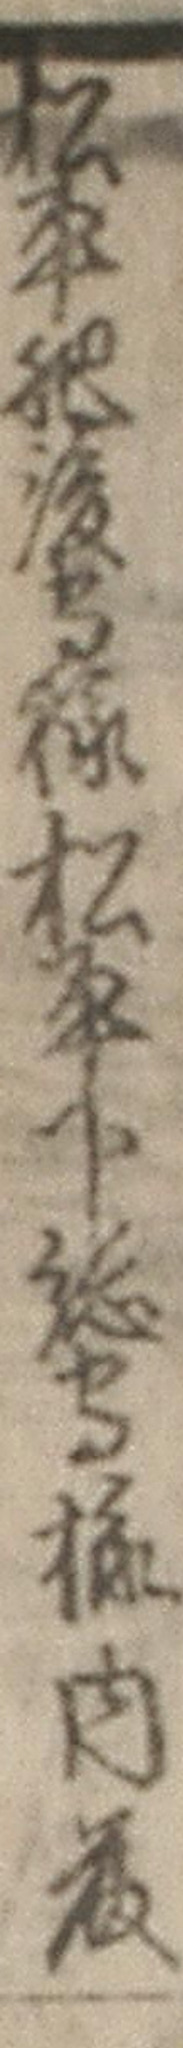松平肥後守様松平下総守様内藤
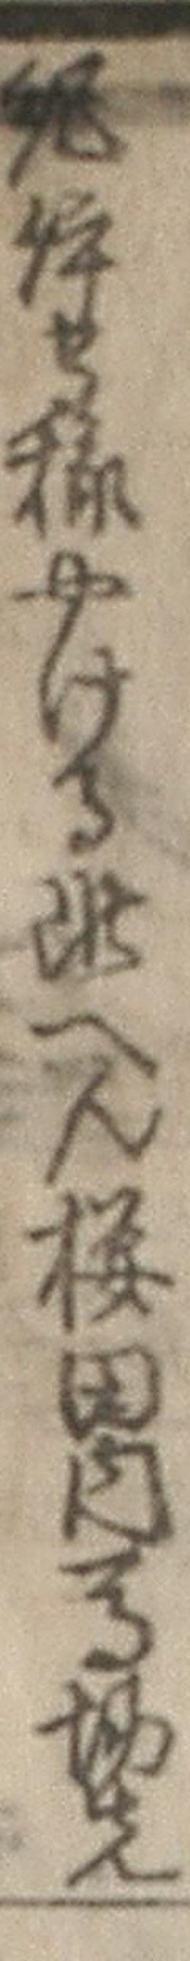紀伊守様やける此へん桜田門馬場先
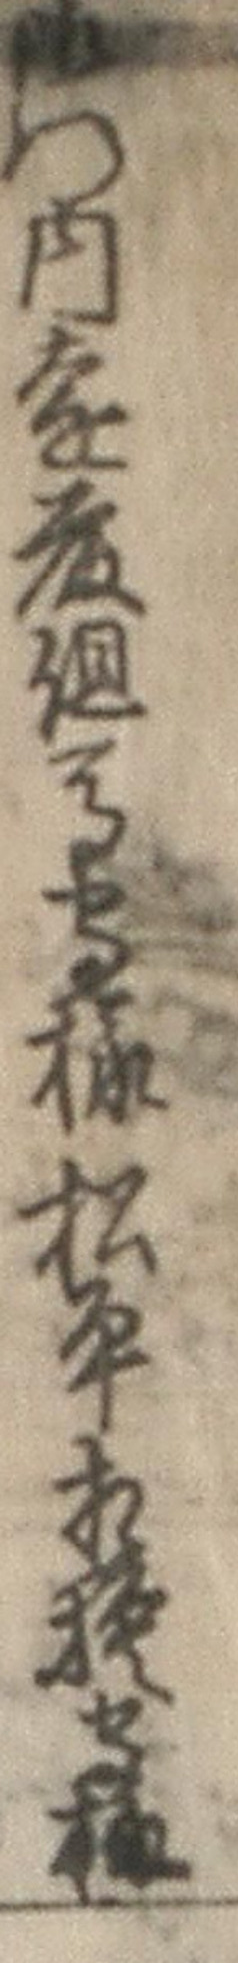御門内遠藤但馬守様松平相模守様
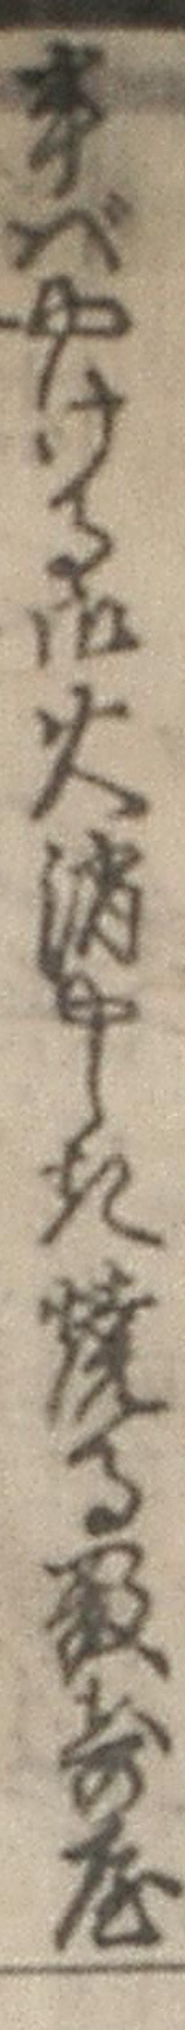半ばやける御火消やしき焼る数寄屋
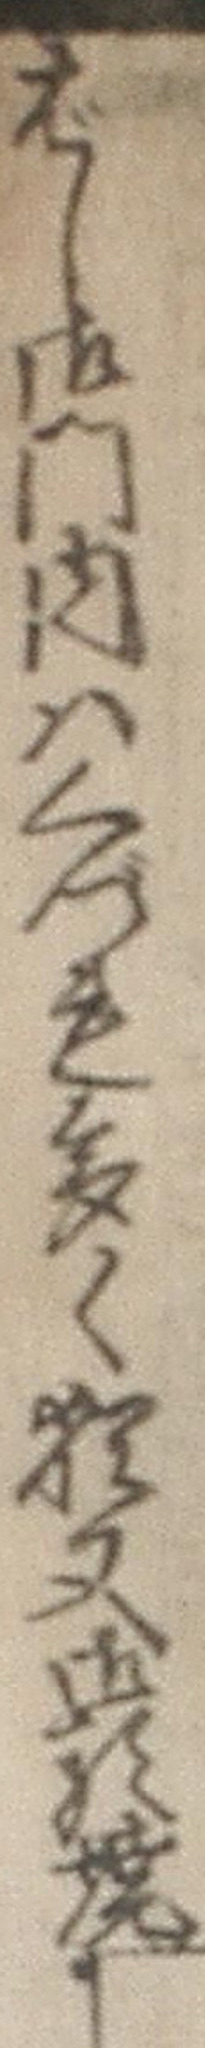ばし御門内はくづれ多く猶又御類焼
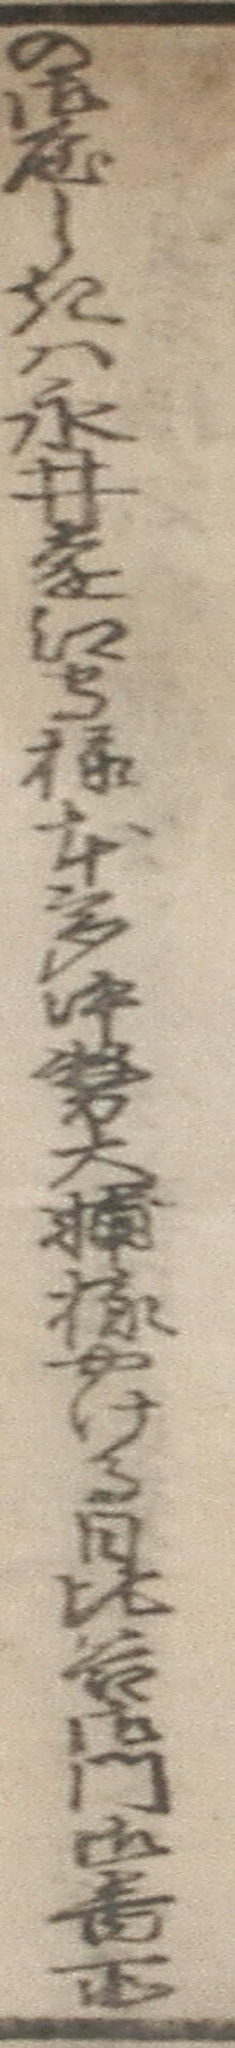の御屋しきは永井遠江守様本多中勢大輔様やける日比谷御門御番所
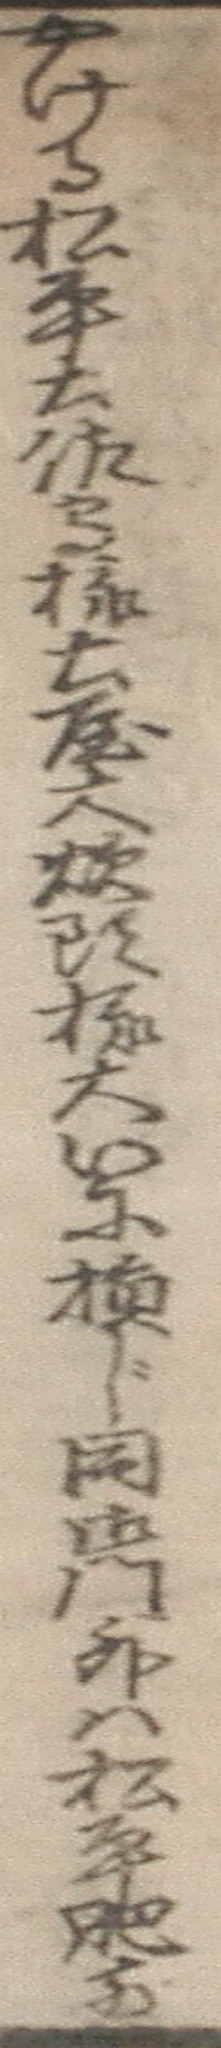やける松平土佐守様土屋大炊頭様大いに損じ同御門外は松平肥前
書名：江戸大地震末代鑑
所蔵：東京大学地震研究所図書室 Earthquake Research Institute Library, The University of Tokyo, JAPAN
